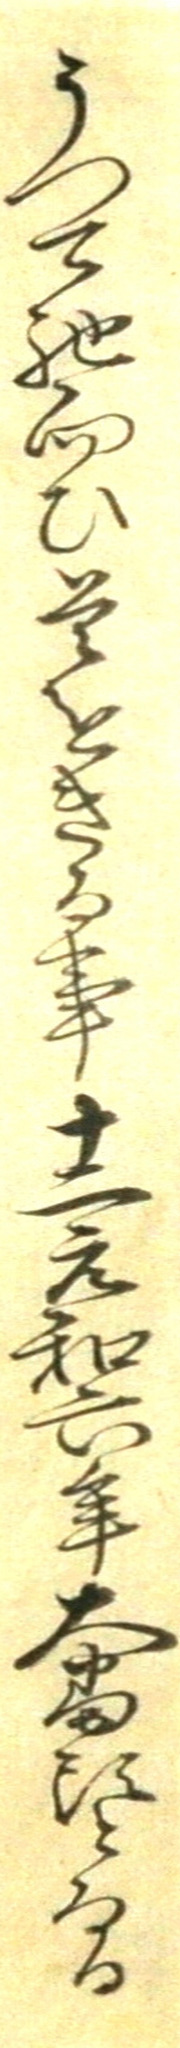うつて馳向ひ首をきる事十二元和六年大番頭となる
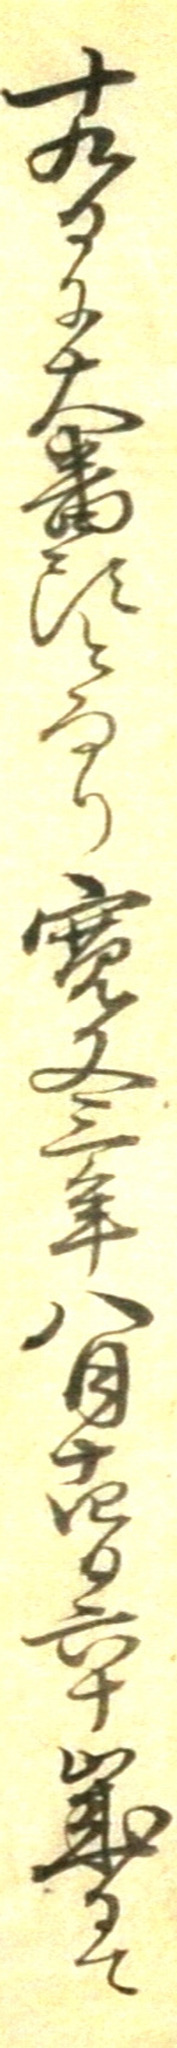十九日に大番頭となり寛文三年八月十四日六十歳にて
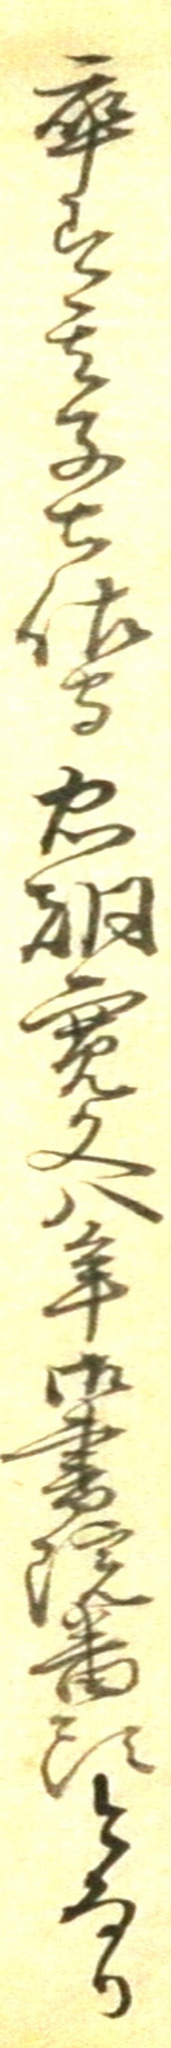卒す其子土佐守忠朝寛文八年御書院番頭となり
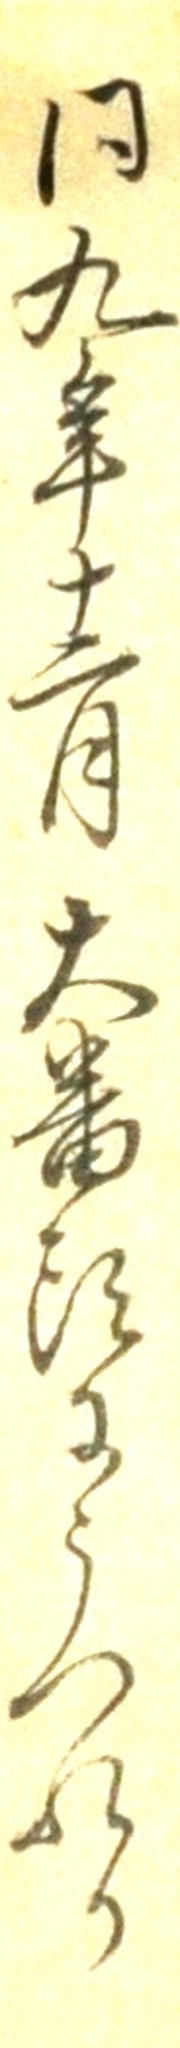同九年十二月大番頭にうつれり
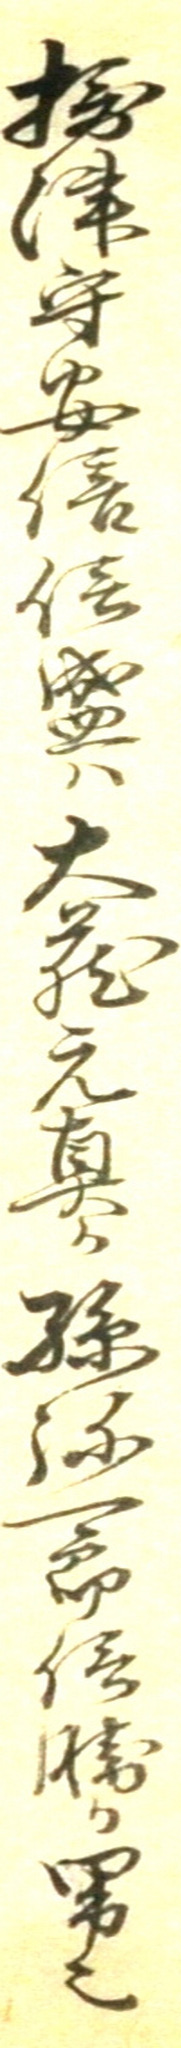摂津守安部信盛は大蔵元真か孫弥一郎信勝か男也
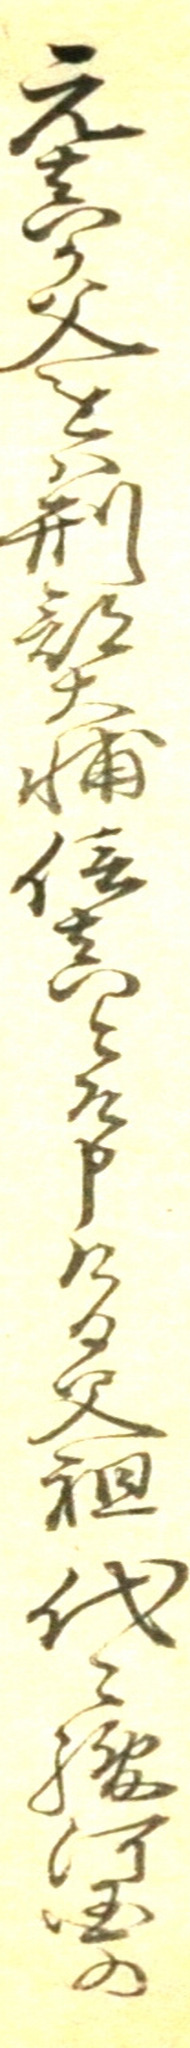元真か父をは刑部大輔信真とそ申ける父祖代々駿河国の
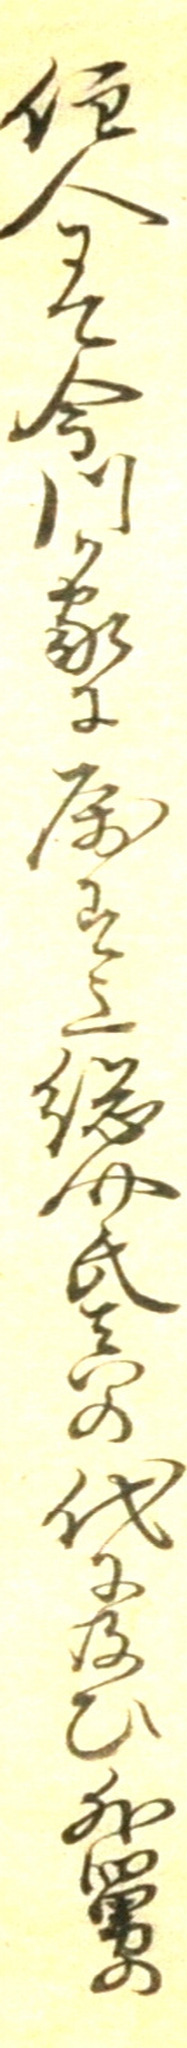住人にて今川か家に属す上総介氏真の代に及ひ外舅の
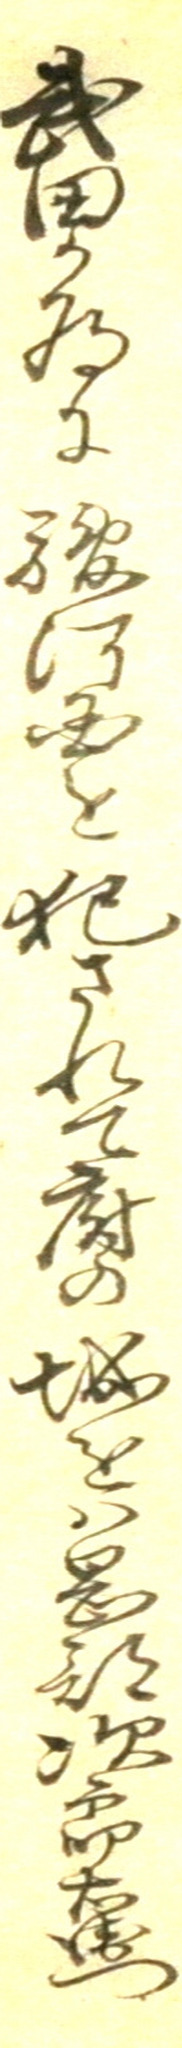武田か為に駿河国を犯されて府の城をは岡部次郎右衛門
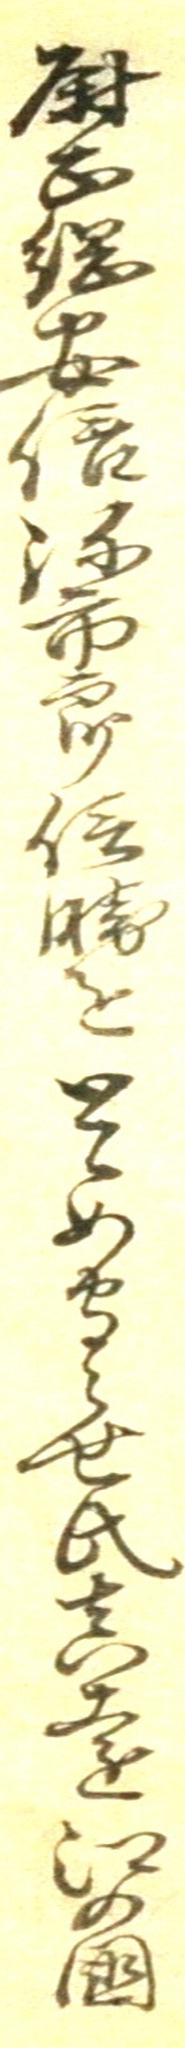尉正綱安部弥市郎信勝をとゝめ守らせ氏真遠江の国
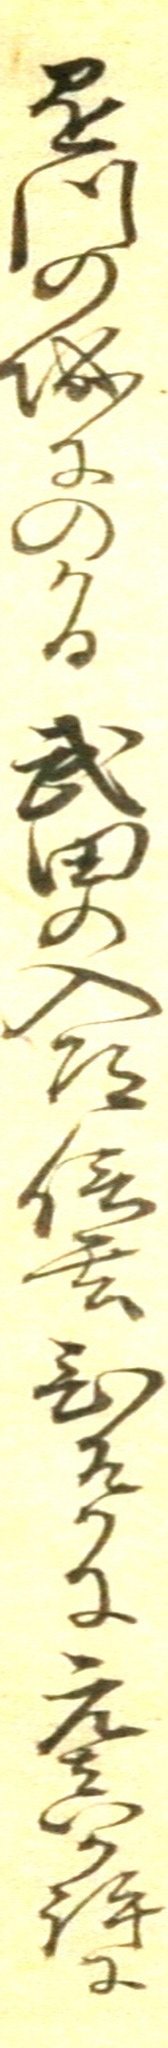懸川の城にのかる武田の入道信玄ひそかに元真か許に
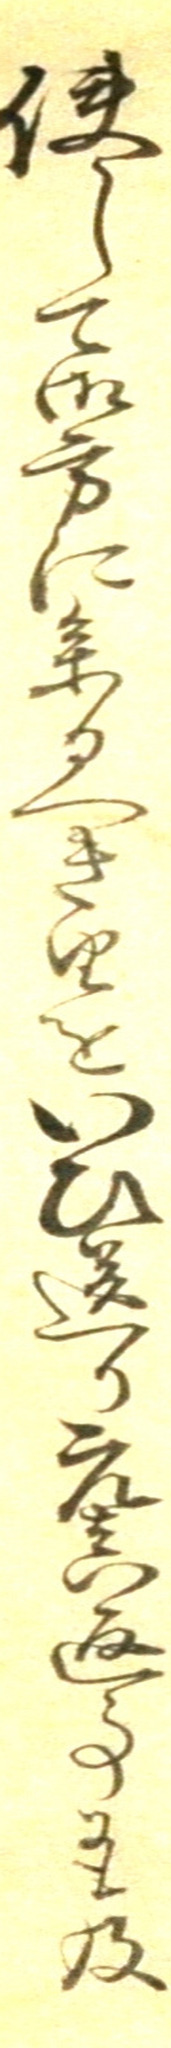使して御方に参るへき由をいひ送り元真返事にも及
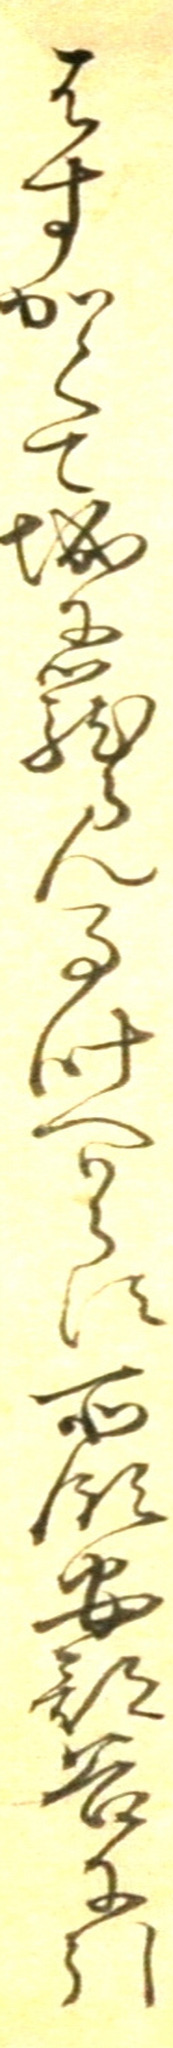はすかくて城に籠らん事叶へからす所領安部谷に引
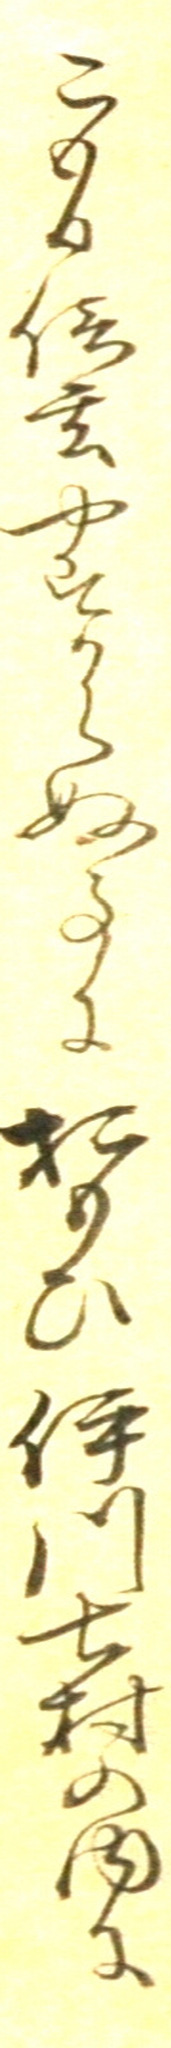こもる信玄やすからぬ事におもひ伊川七村の内に

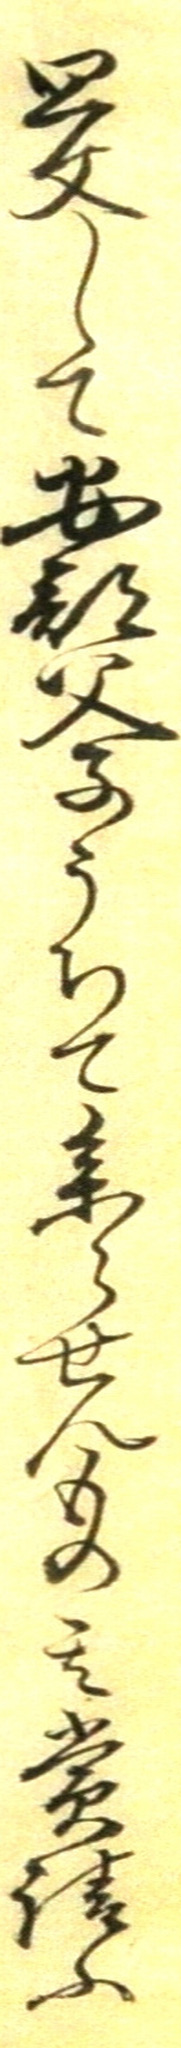廻文して安部父子うちて参らせんもの其賞請ふ
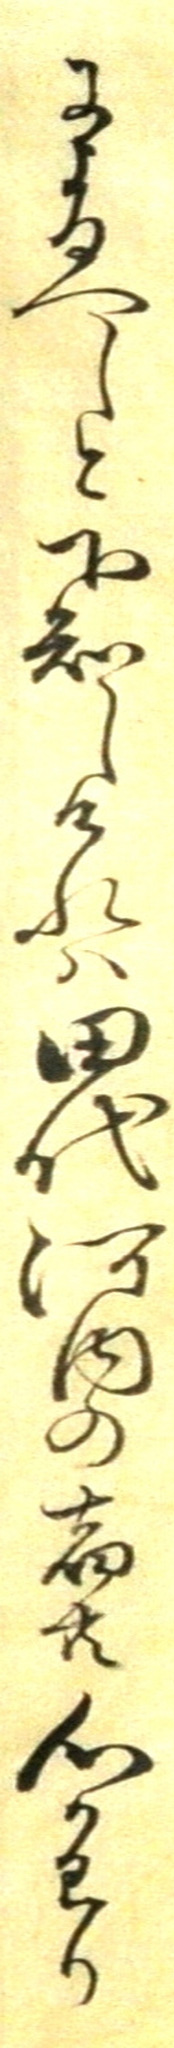によるへしと下知しけれは田代河内の者共心かわり
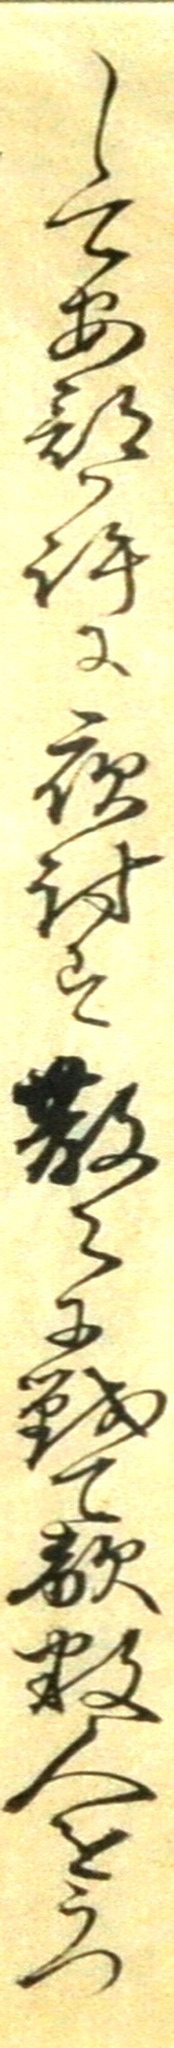して安部か許に夜討す散々に戦て敵数人をうつ
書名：藩翰譜（四・中）
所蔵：伊那市立高遠町図書館・合同会社AMANE
